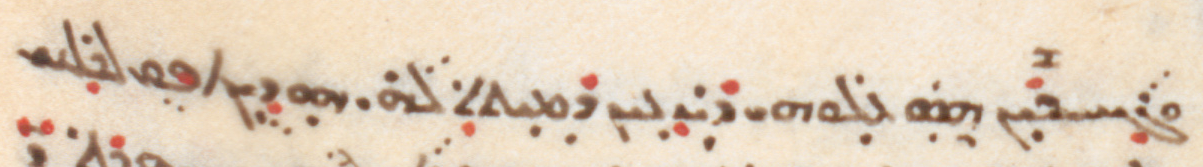ܘܓܚܟܝ̣ܢ ܗܘܘ ܥܠܘܗܝ ܕܝܕܥܝܢ ܕܡܝ̣ܬܬ݀ ܠܗ̇. ܗܘ ܕܝܢ ܐܦܩ ܠܟܠܢܫ
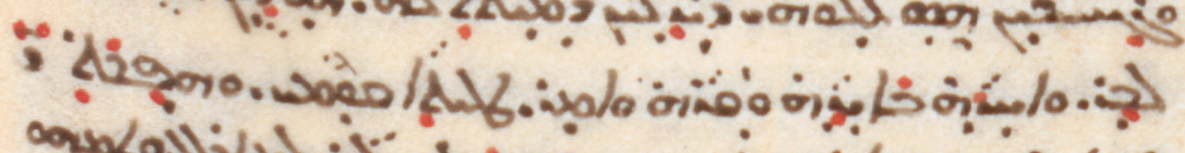ܠܒܪ. ܘܐܚܕܗ̇ ܒܐܝܕܗ̇ ܘܩܪܗ̇ ܘܐܡ̣ܪ: ܛܠܝܬܐ ܩܘܡܝ. ܘܗ̣ܦܟܬ݀ ܏ܪ
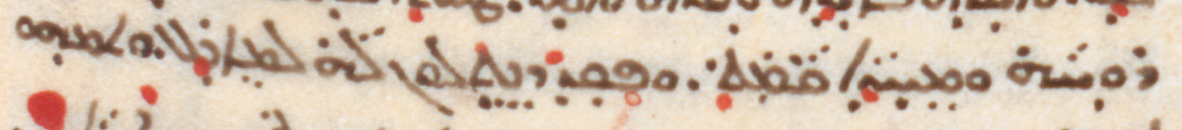ܪܘܚܗ̇ ܘܡܚܕܐ ܩܡܬ݀. ܘܦܩ̣ܕ ܕܢܬܠܘܢ ܠܗ̇ ܠܡܐܟܠ. ܘܬܡܗ̣ܘ
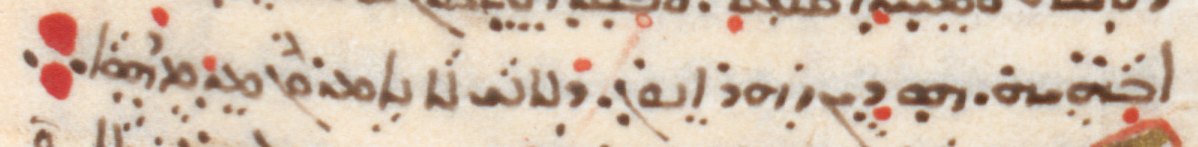ܐܒܗ̈ܝܗ̇. ܗ̣ܘ ܕܝܢ ܙ̣ܗܪ ܐܢܘܢ܆ ܕܠܐܢܫ ܠܐ ܢܐܡܪܘܢ ܡܕܡ ܗܘܐ܀
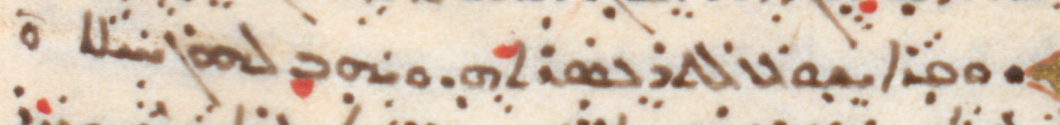ܘܩ̣ܪܐ ܝܫܘܥ ܠܬܪܥܣܪܬܗ܆ ܘܝܗ̣ܒ ܠܗܘܢ ܚܝܠܐ ܏ܘ
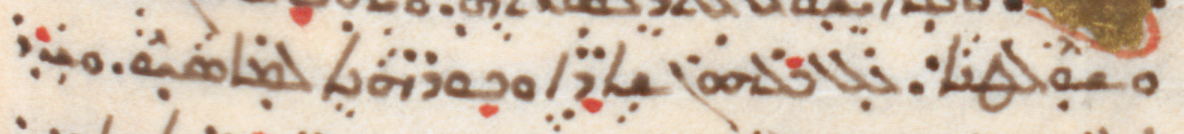ܘܫܘܠܛܢܐ܇ ܥܠ ܟܠܗܘܢ ܫܐܕ̈ܐ ܘܟܘܪ̈ܗܢܐ ܠܡܐܣܝܘ. ܘܫܕܪ
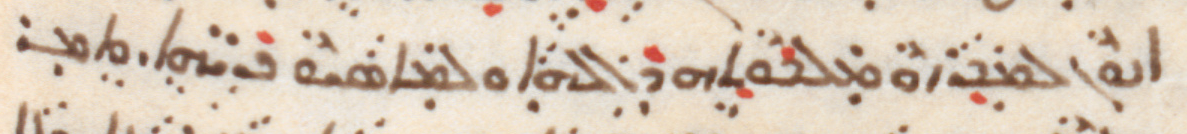ܐܢܘܢ ܠܡܟܪܙܘ ܡܠܟܘܬܗ ܕܐܠܗܐ ܘܠܡܐܣܝܘ ܟܪ̈ܝܗܐ. ܘܐܡ̣ܪ
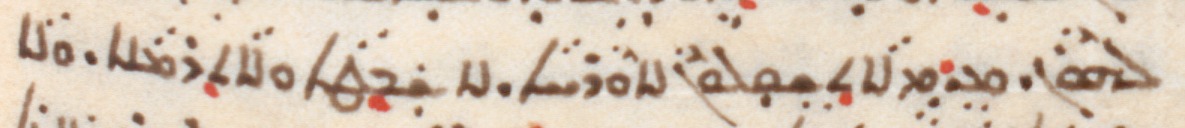ܠܗܘܢ. ܡܕܡ ܠܐ ܬܫܩܠܘܢ ܠܐܘܪܚܐ. ܠܐ ܫܒܛܐ ܘܠܐ ܬܪܡܠܐ. ܘܠܐ
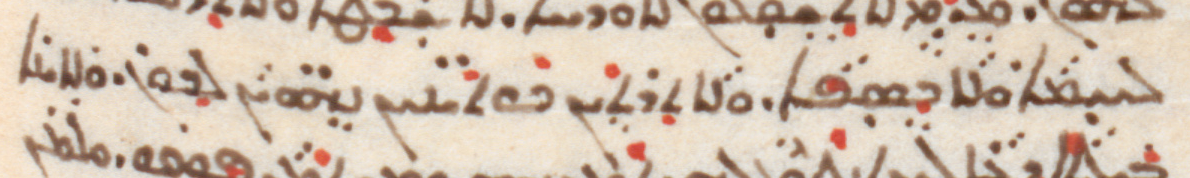ܠܚܡܐ ܘܠܐ ܟܣܦܐ. ܘܠܐ ܬܪܬܝܢ ܟܘܬܝܢ̈ܝܢ ܢܗ̈ܘܝܢ ܠܟܘܢ. ܘܠܐܝܢܐ
